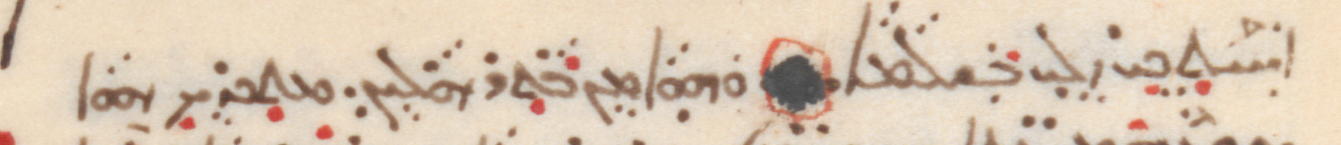ܐܚܝܬܟܝ ܙܠ̣ܝ ܒܫܠܡܐ܀ ܘܗܘܐ ܡ̣ܢ ܒܬܪ ܗܠܝܢ܆ ܡܬܟܪܟ ܗܘܐ
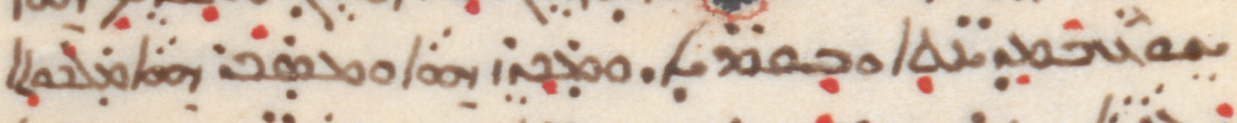ܝܫܘܥ ܒܡܕܝܢ̈ܬܐ ܘܒܩܘܪ̈ܝ̣ܐ܆ ܘܡܟܪܙ ܗܘܐ ܘܡܣܒܪ ܗܘܐ ܡܠܟܘܬܐ
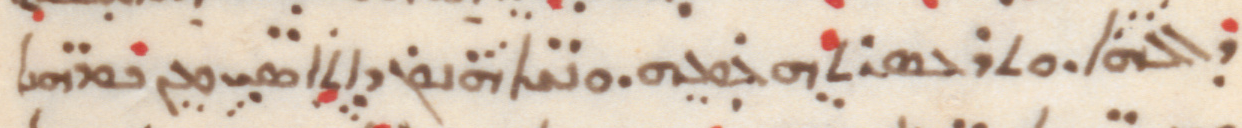ܕܐܠܗܐ. ܘܬܪܥܣܪܬܗ ܥܡܗ. ܘܢܫ̈ܐ ܗ̇ܢܘܢ ܕܐܬܐܣܝ ܡ̣ܢ ܟܘܪ̈ܗܢܐ
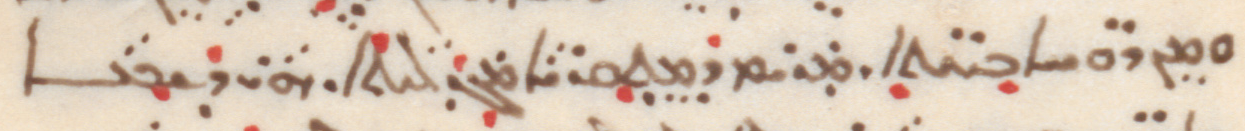ܘܡ̣ܢ ܪ̈ܘܚܐ ܒܝ̈ܫܬܐ. ܡܪܝܡ ܕܡܬ̣ܩܪܝܐ ܡ̇ܓܕܠܝܬܐ. ܗ̇ܝ ܕܫܒܥܐ
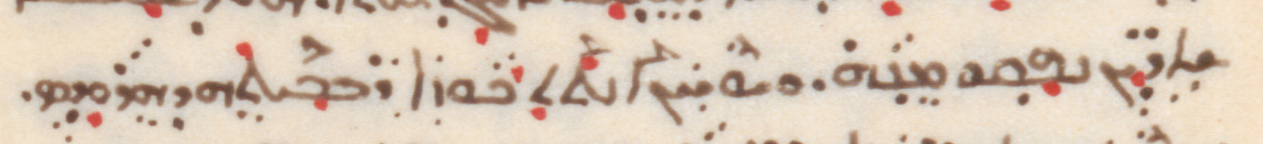ܫܐܕ̈ܝܢ ܢܦܩ̣ܘ ܡܢܗ̇. ܘܝܘܚܢ ܐܢܬܬ ܟܘܙܐ ܪܒܒܝܬܗ ܕܗܪܘܕܣ.
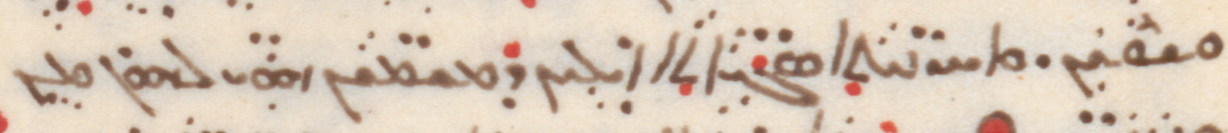ܘܫܘܫܢ. ܘܐܚܪ̈ܢܝܬܐ ܣܓ̈ܝܐܬܐ ܐܝܠܝܢ ܕܡܫܡ̈ܫܢ ܗܘ̈ܝ ܠܗܘܢ ܡ̣ܢ
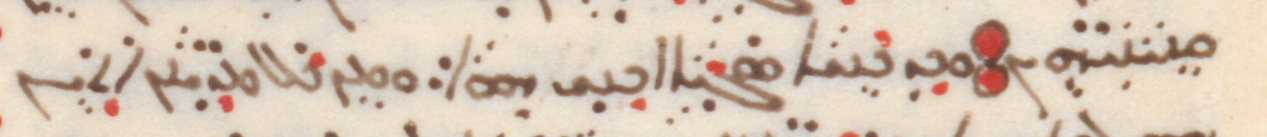ܩܢܝܢܝ̈ܗܝܢ܀܀ ܘܟܕ ܟܢܫܐ ܣܓܝܐܐ ܟܢ̣ܫ ܗܘܐ܇ ܘܡ̣ܢ ܟܠ ܡܕܝ̈ܢܢ ܐܬܝ̇ܢ
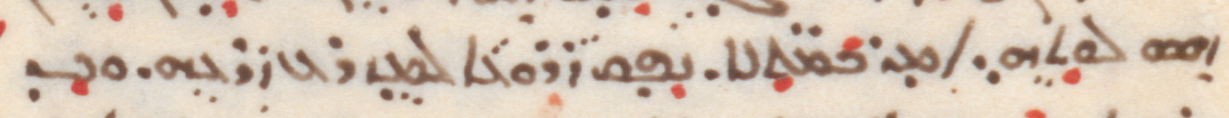ܗܘܘ ܠܘܬܗ܆ ܐܡ̣ܪ ܒܡ̈ܬܠܐ. ܢܦ̣ܩ ܙܪܘܥܐ ܠܡܙܪܥ ܙܪܥܗ. ܘܟܕ
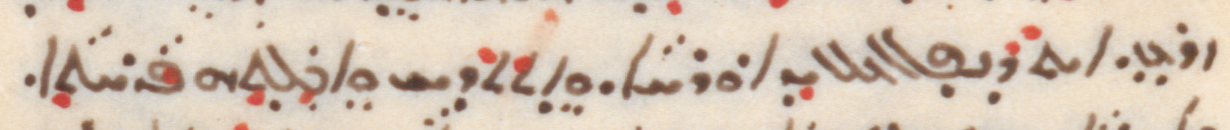ܙܪܥ̣܆ ܐܝܬ ܕܢܦ̣ܠ ܥܠ ܝܕ ܐܘܪܚܐ. ܘܐ̣ܬܬܕܝܫ ܘܐܟܠܬܗ ܦܪܚܬܐ.
